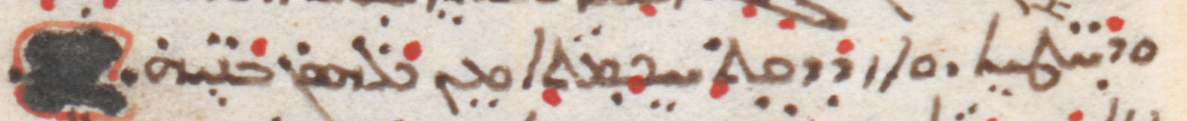ܘܕܚ̈ܛܝܐ. ܘܐܙܕܕܩ̣ܬ ܚܟܡܬܐ ܡ̣ܢ ܟܠܗܘܢ ܒܢ̈ܝܗ̇.
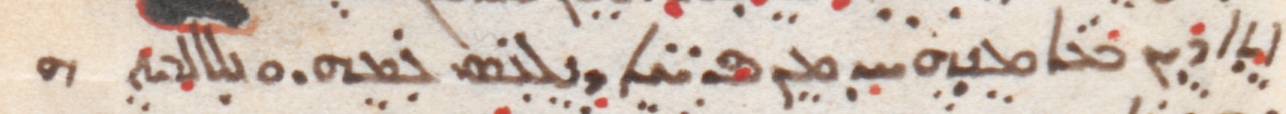ܐܬ̣ܐ ܕܝܢ ܒܥܐ ܡܢ̣ܗ ܚܕ ܡ̣ܢ ܦܪ̈ܝܫܐ ܕܢܠܥ̣ܣ ܥܡܗ. ܘܥ̣ܠ ܠܒܝܬܗ
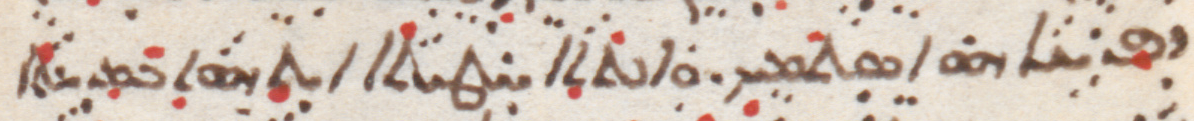ܕܦܪܝܫܐ ܗ̇ܘ ܐܣܬܡ̣ܟ. ܘܐܢܬܬܐ ܚܛܝܬܐ ܐܝܬ ܗܘܬ ܒܡܕܝܢܬܐ
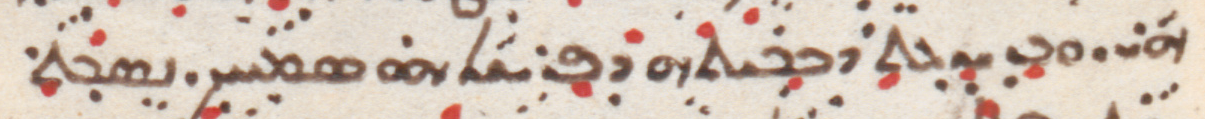ܗ̇̇ܝ. ܘܟܕ ܝܕܥ̣ܬ ܕܒܒܝܬܗ ܕܦܪܝܫܐ ܗ̇ܘ ܣܡܝܟ܆ ܢܣܒ̣ܬ݀
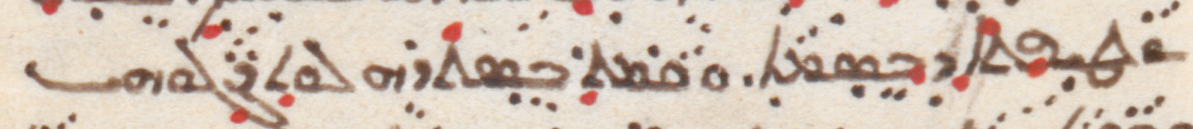ܫܛܝܦܬܐ ܕܒܣܡܐ. ܘܩܡ̇ܬ݀ ܒܣܬܪܗ ܠܘܬ ܪ̈ܓܠܘܗܝ
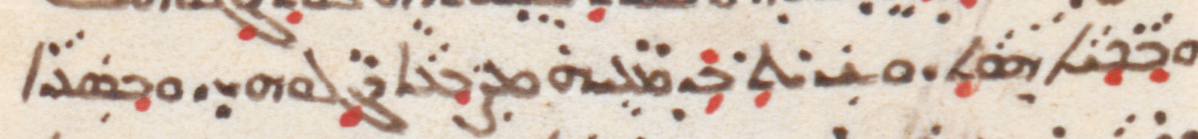ܘܒܟܝܐ ܗܘܬ. ܘܫܪܝܬ ܒܕܡ̈ܥܝܗ̇ ܡܨܒܥܐ ܪ̈ܓܠܘܗܝ. ܘܒܣܥܪܐ
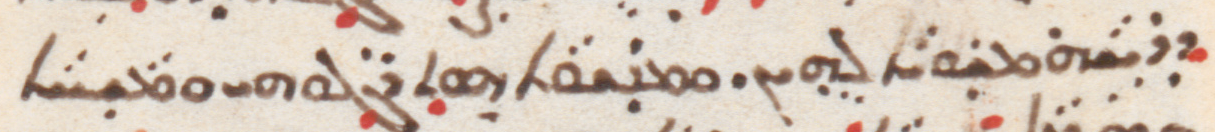ܕܪܝܫܗ̇ ܡܫܘܝܐ ܠܗܝܢ. ܘܡܢܫܩ̇ܐ ܗܘܬ ܪ̈ܓܠܘܗܝ ܘܡܫܚܐ
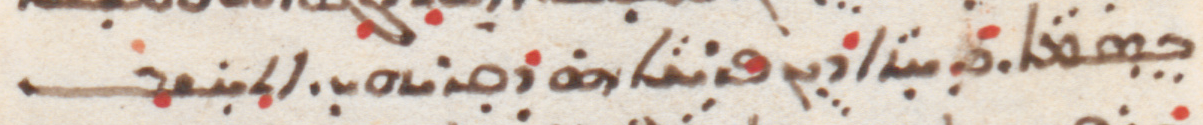ܒܣܡܐ. ܟܕ ܚ̣ܙܐ ܕܝܢ ܦܪܝܫܐ ܗ̇ܘ ܕܩܪܝܗܝ܆ ܐܬܚܫܒ
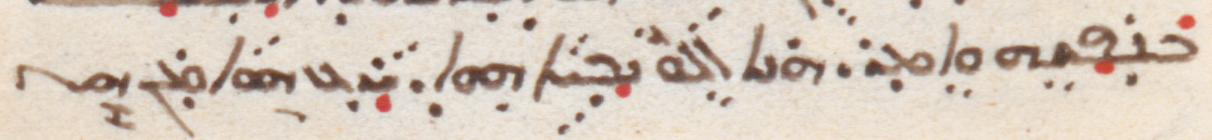ܒܢܦܫܗ ܘܐܡ̣ܪ. ܗܢܐ ܐܠܘ ܢܒܝܐ ܗܘܐ. ܝ̇ܕܥ ܗܘܐ ܡ̇ܢ ܗ̣ܝ
